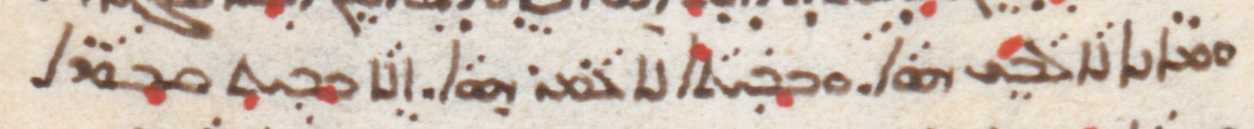ܘܡ̈ܐܢܐ ܠܐ ܠܒ̣ܫ ܗܘܐ. ܘܒܒܝܬܐ ܠܐ ܥܡ̇ܪ ܗܘܐ. ܐܠܐ ܒܒܝܬ ܩܒܘܪ̈ܐ
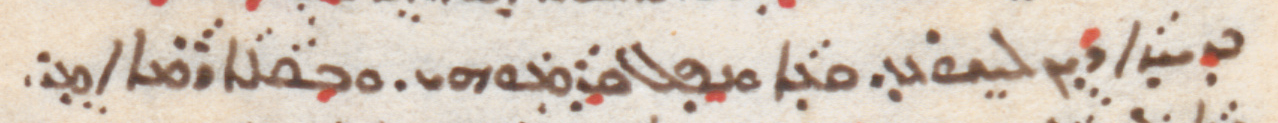ܟܕ ܚܙ̣ܐ ܕܝܢ ܠܝܫܘܥ܆ ܩܥ̣ܐ ܘܢܦ̣ܠ ܩܕܡܘܗܝ. ܘܒܩܠܐ ܪܡܐ ܐܡ̣ܪ.
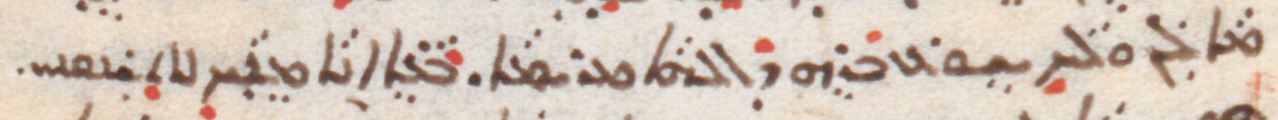ܡܐ ܠܢ ܘܠܟ ܝܫܘܥ ܒܪܗ ܕܐܠܗܐ ܡܪܝܡܐ. ܒ̇ܥܐ ܐܢܐ ܡܢܟ ܠܐ ܬܫܢܩܢܝ.
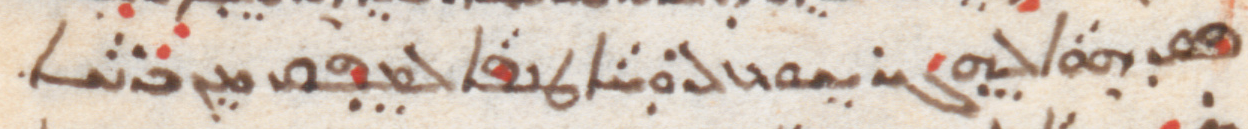ܦܩܕ ܗܘܐ ܠܗ ܓܝܪ ܝܫܘܥ ܠܪܘܚܐ ܛܢܦܐ ܠܡܦܩ ܡ̣ܢ ܒܪܢܫܐ.
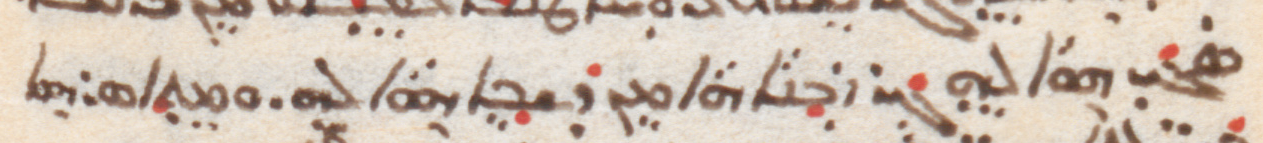ܣܓܝ ܗܘܐ ܠܗ ܓܝܪ ܙܒܢܐ ܗ̇ܐ ܡ̣ܢ ܕܫܒܐ ܗܘ̇ܐ ܠܗ. ܘܡܬܐܣܪ ܗܘܐ
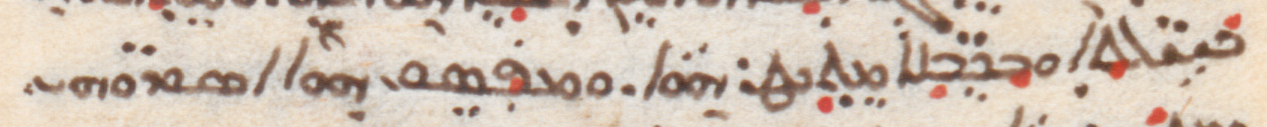ܒܫܫ̈ܠܬܐ ܘܒܟ̈ܒܠܐ ܡܬ̣ܢܛܪ ܗܘ̇ܐ. ܘܡܦܣܩ ܗܘܐ ܐܣܘܪ̈ܘܗܝ.
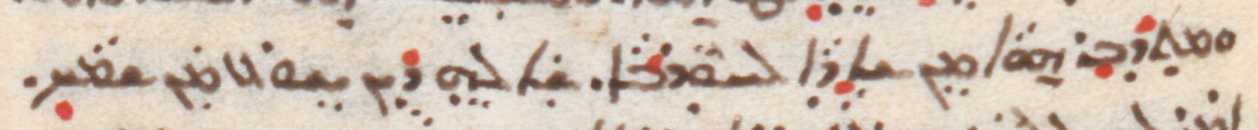ܘܡܬܕܒܪ ܗܘܐ ܡ̣ܢ ܫܐܕܐ ܠܚܘܪܒܐ. ܫܐܠܗ ܕܝܢ ܝܫܘܥ ܡ̇ܢ ܫܡܟ.
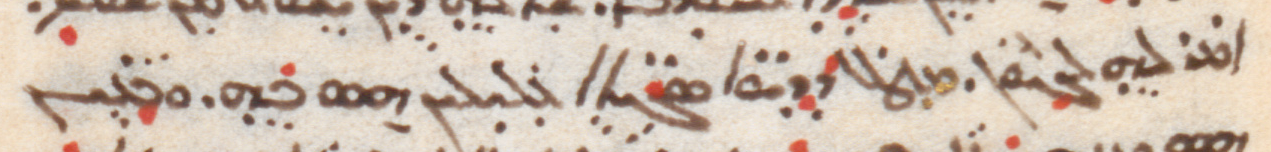ܐܡ̇ܪ ܠܗ ܠܓܝܘܢ. ܡܛܠ ܕܕܝ̈ܘܐ ܣܓܝ̈ܐܐ ܥܠܝܠܝܢ ܗܘܘ ܒܗ. ܘܒ̇ܥܝܢ
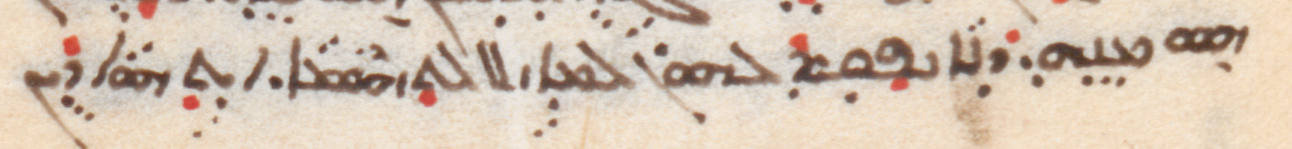ܗ̣ܘܘ ܡܢܗ܆ ܕܠܐ ܢܦܩ̣ܘܕ ܠܗܘܢ ܠܡܐܙܠ ܠܬܗܘܡܐ. ܐܝ̣ܬ ܗܘܐ ܕܝܢ
